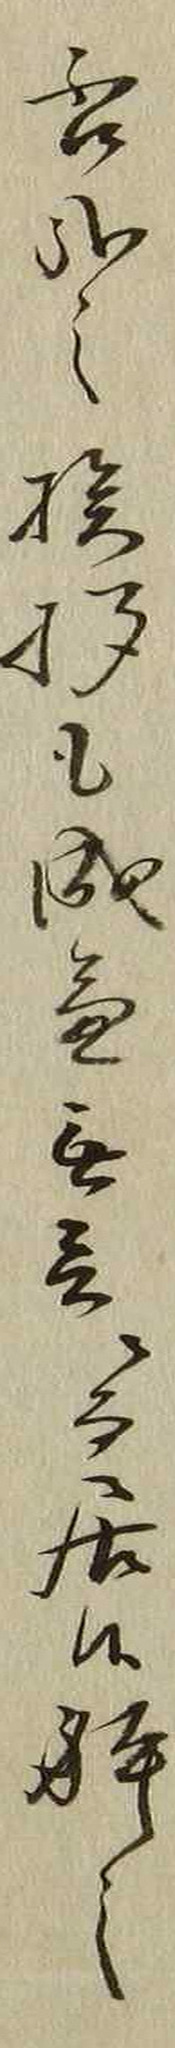否哉之挨拶も成兼無言ニ而居候躰之
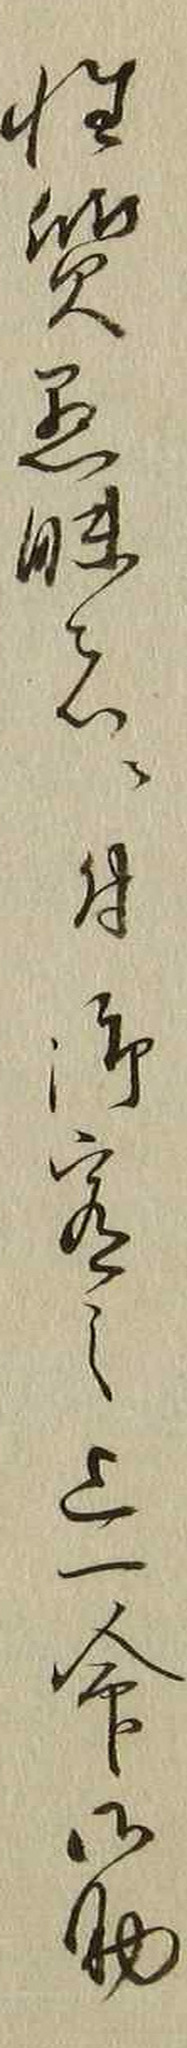性質愚昧者ニ付御宥之上一命御助
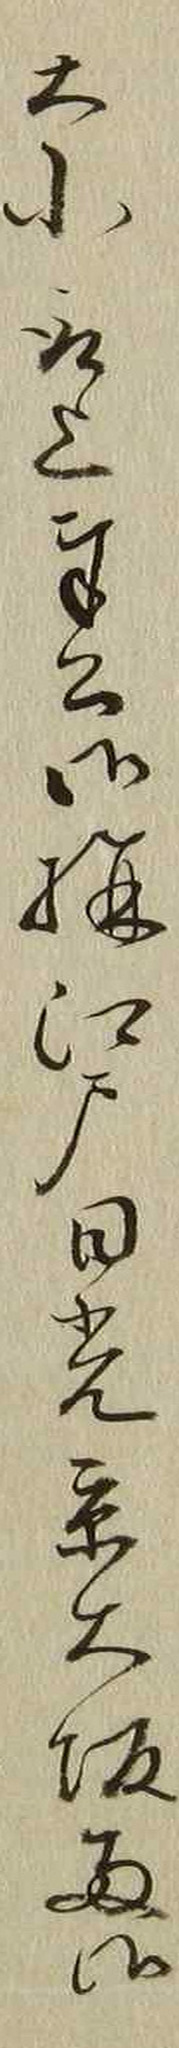大小取上奉公御構江戸日光京大坂両御
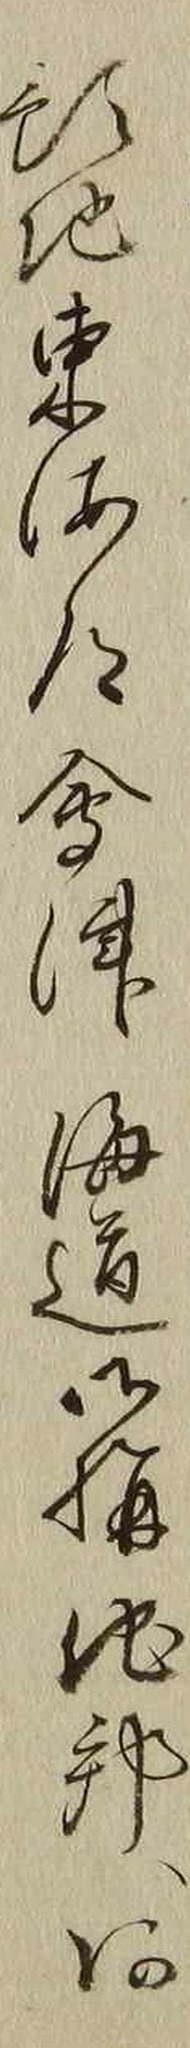預地東海道会津海道御構他邦ヘ阿
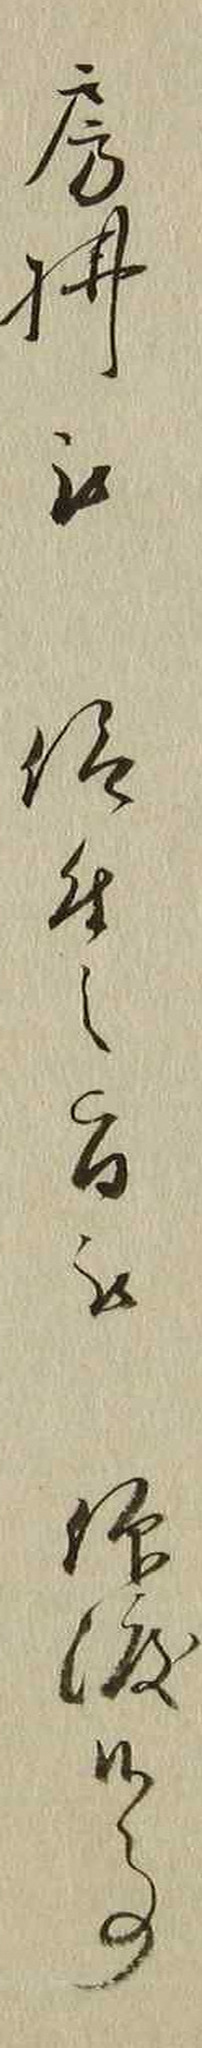房拂被仰付之旨被仰渡候事
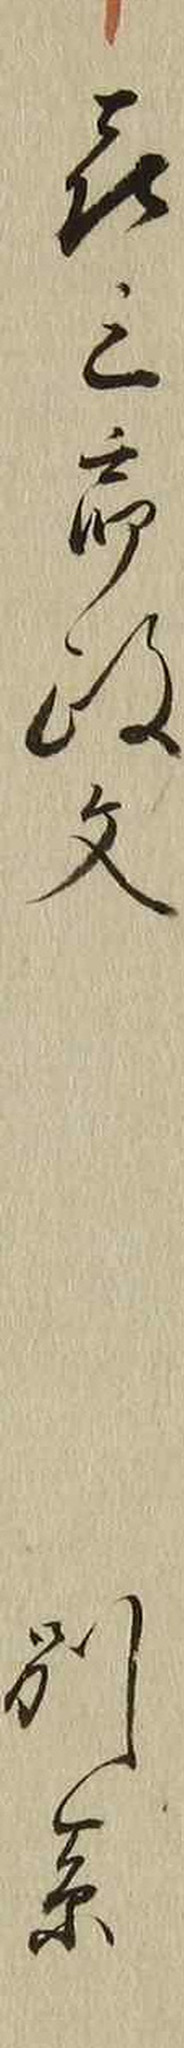喜三郎政文別系
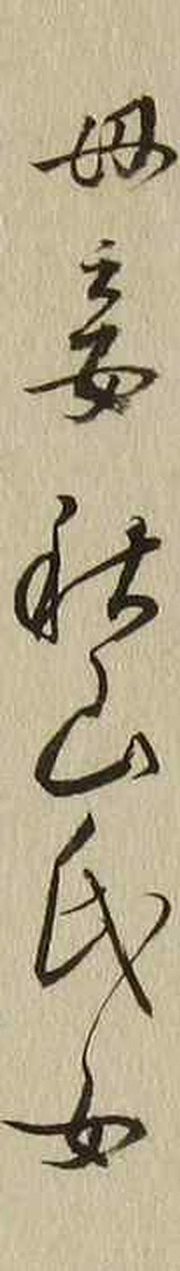母妾秋山氏女
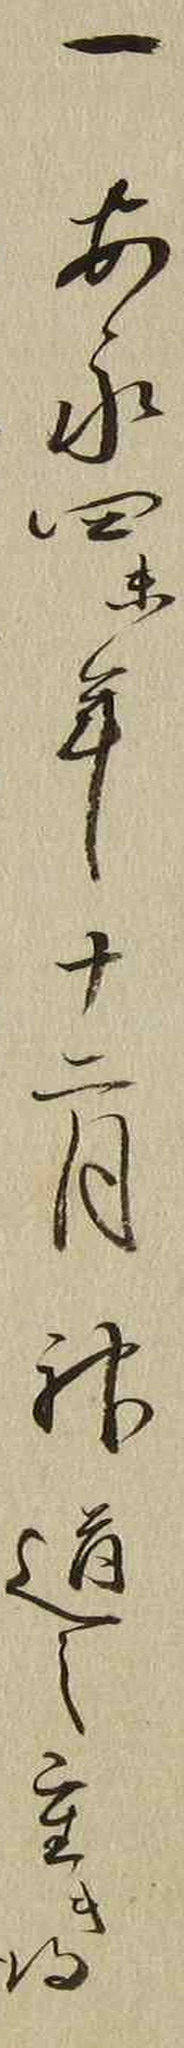一安永四未年十二月神道之重キ得
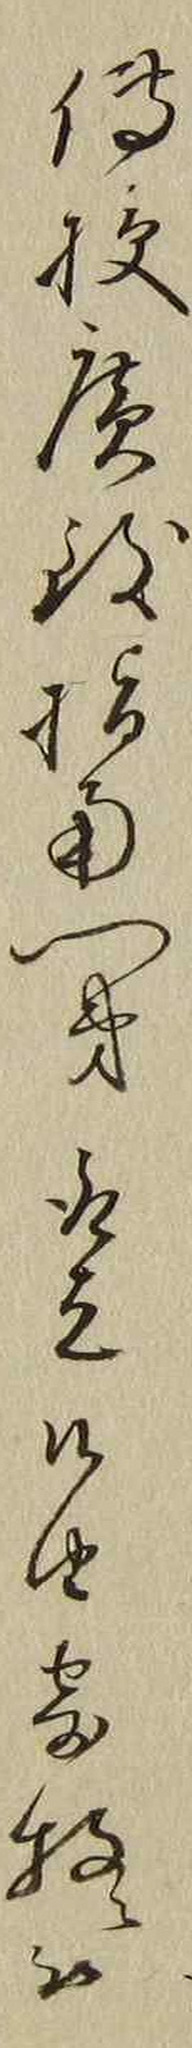伝授廣致指南門弟取立候由奇特ニ被
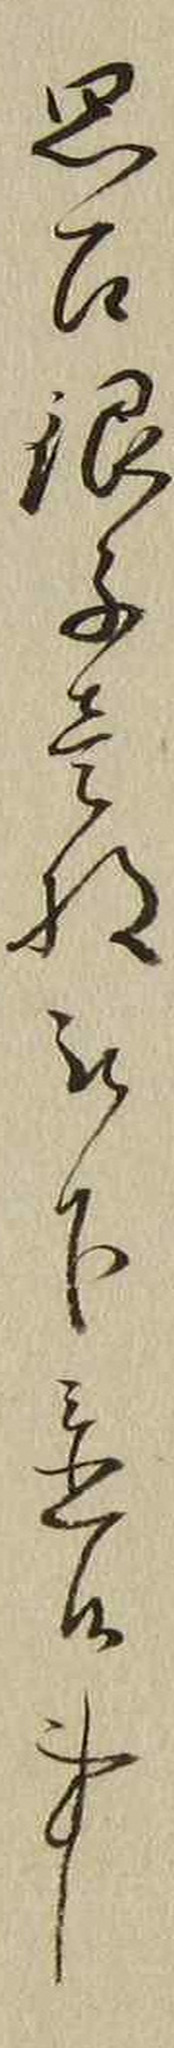思召銀子壱枚被下置候事
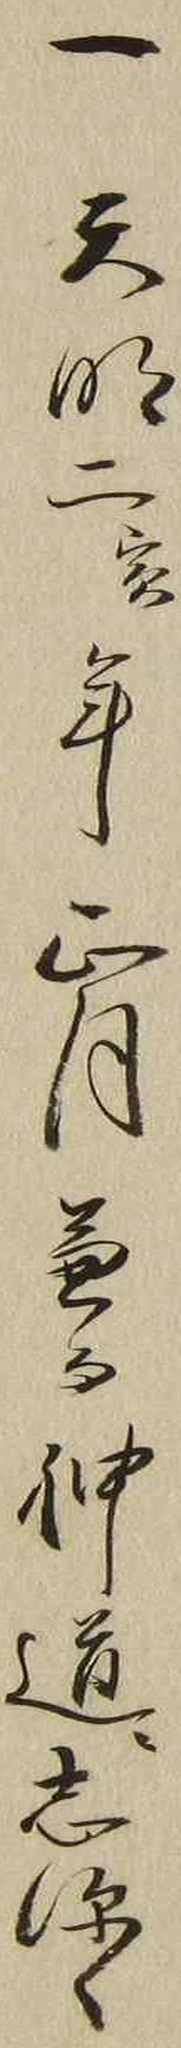一天明二亥年正月兼而神道ニ志深く
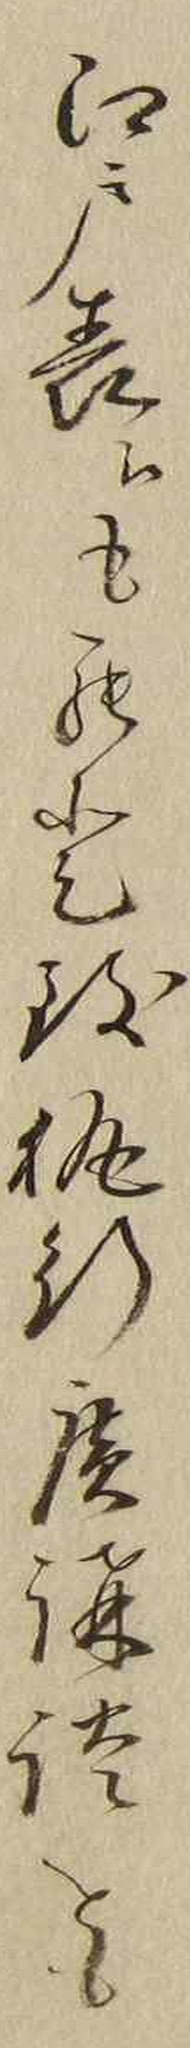江戸表江も罷登致執行廣講談をも

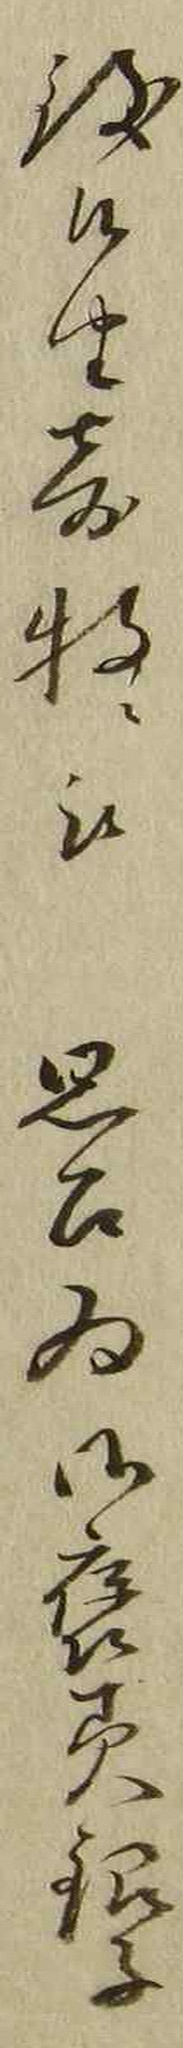致候由奇特ニ被思召為御褒美銀子
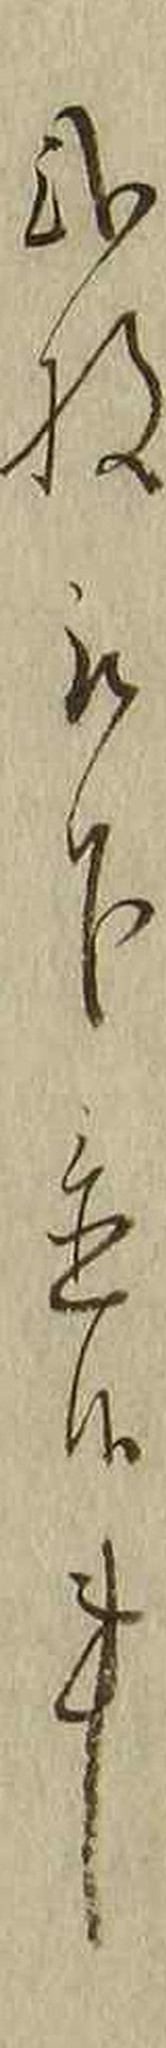弐枚被下置候事
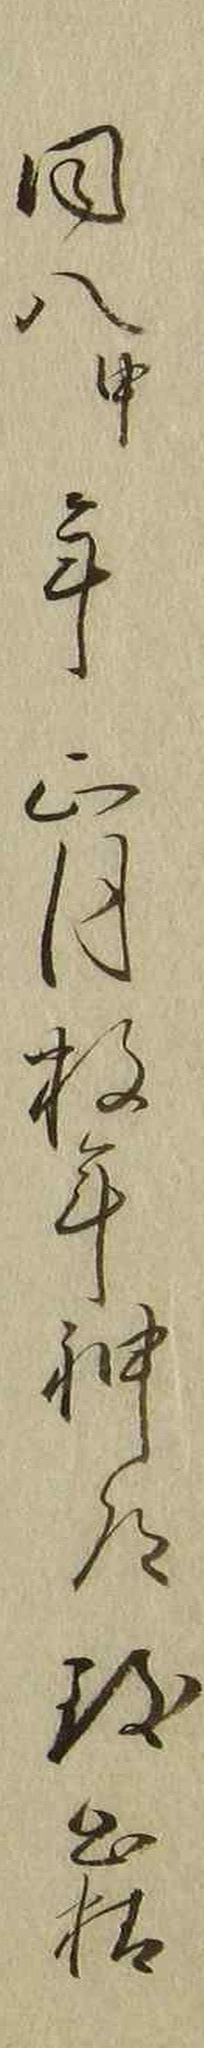一同八申年正月数年神道致出精
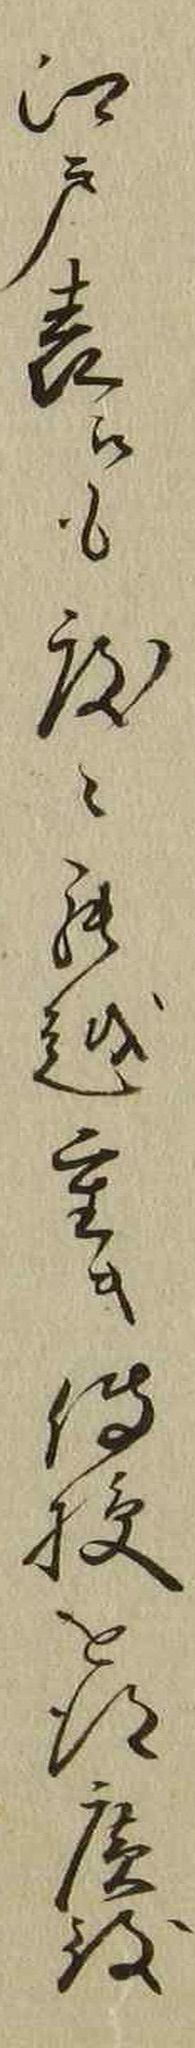江戸表江も度々罷越重キ伝授を得廣致
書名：諸士系譜　巻之68　を之部2
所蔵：会津若松市立会津図書館
